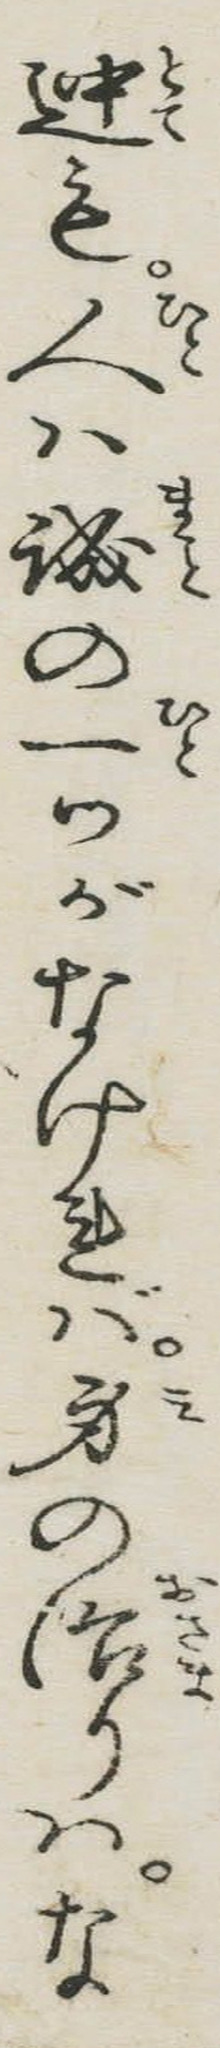迚も。人は誠の一つがなければ。身の治りは。な
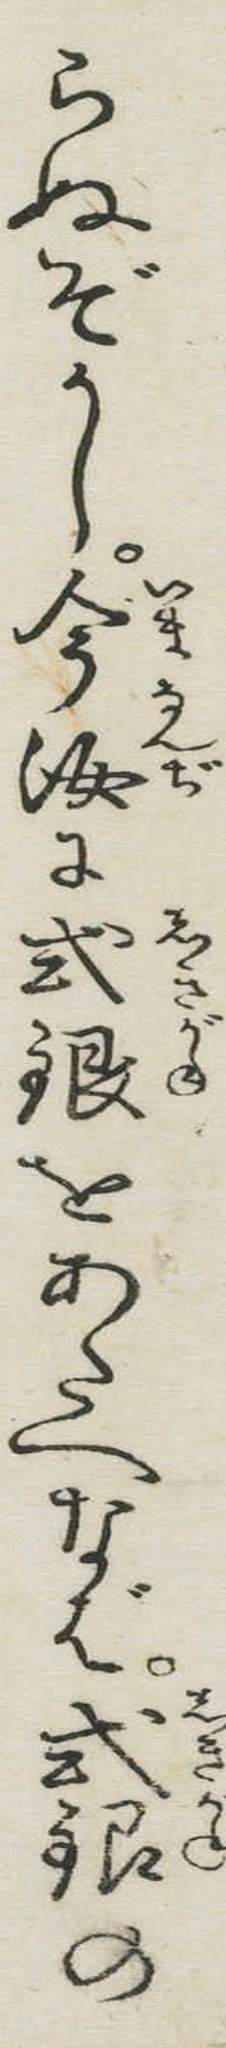らぬぞかし。今汝に式銀をあたへなば。式銀の
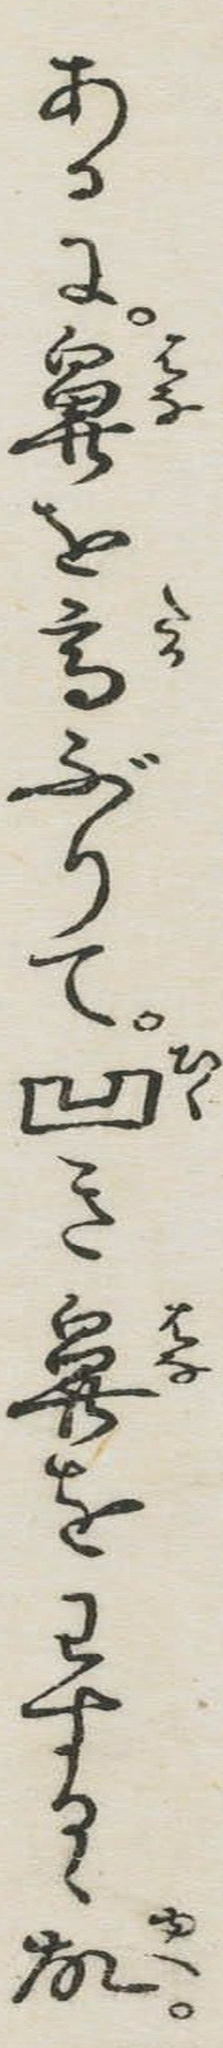あるに。鼻を高ぶりて。凹き鼻をわするゝ故。
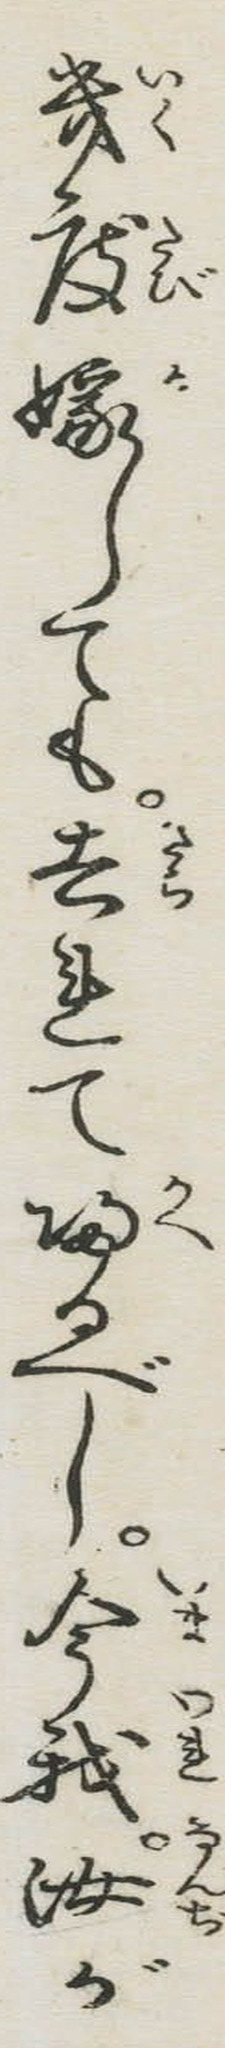幾度嫁しても。去れて帰るべし。今我。汝が
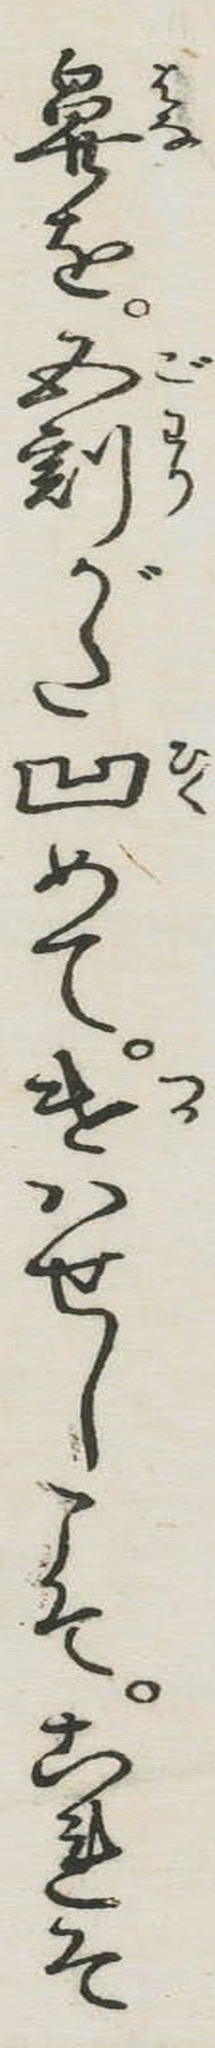鼻を。五割がた凹めて。遣はせしこそ。これそ
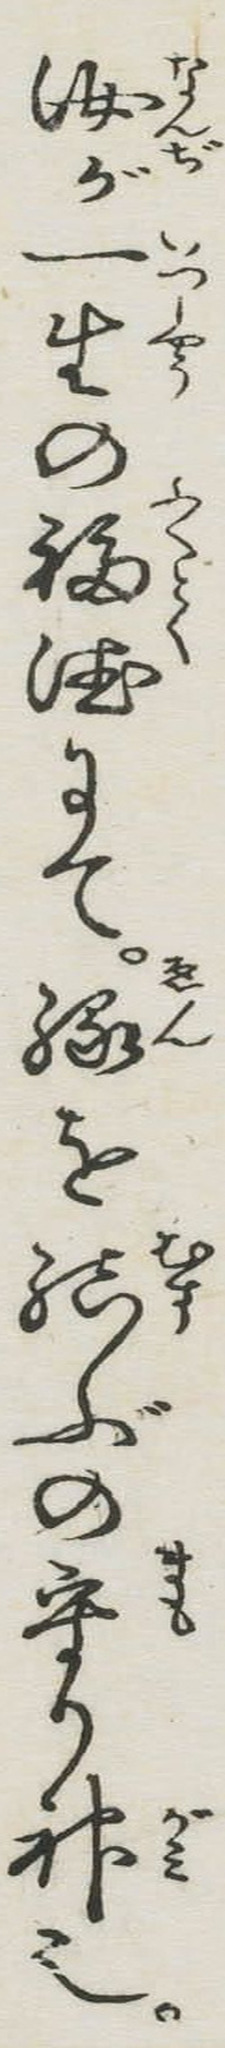汝が一生の福徳にて。縁を結ぶの守り神也。
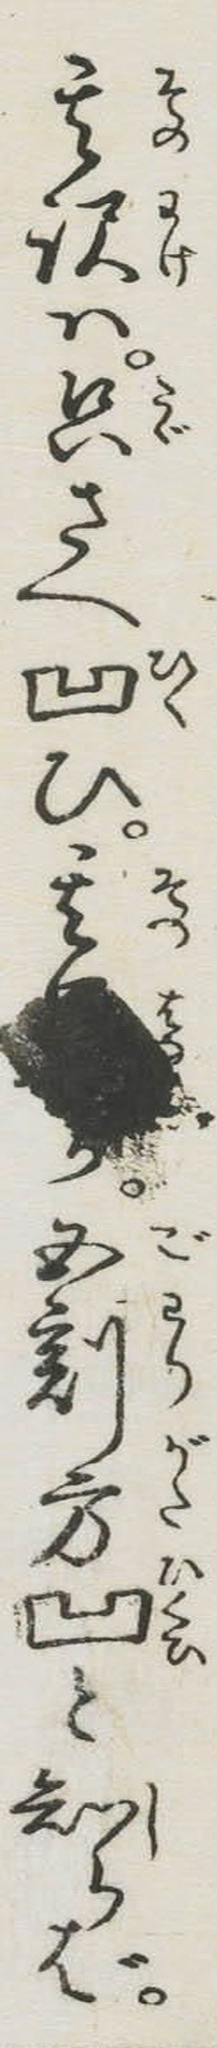其訳は。只さへ凹ひ。其。五割方凹と知らば。
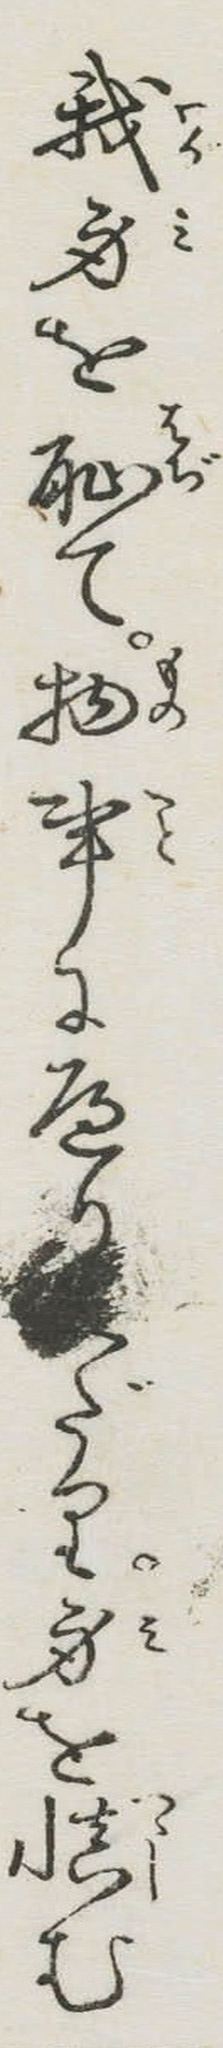我身を恥て。物事にへりだり。身を慎む
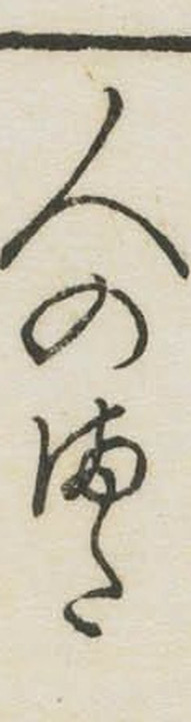人のまた
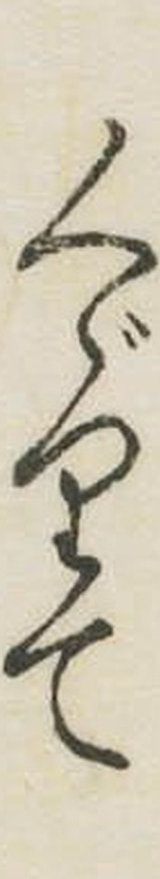くゞりて
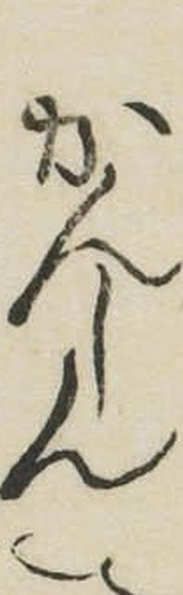かんしん

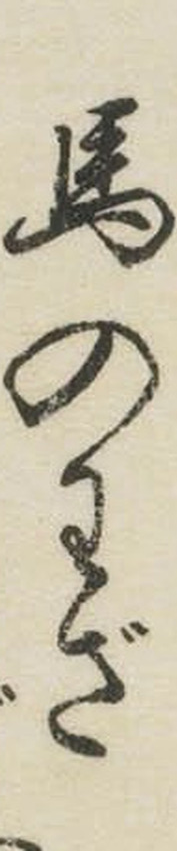馬のわざ
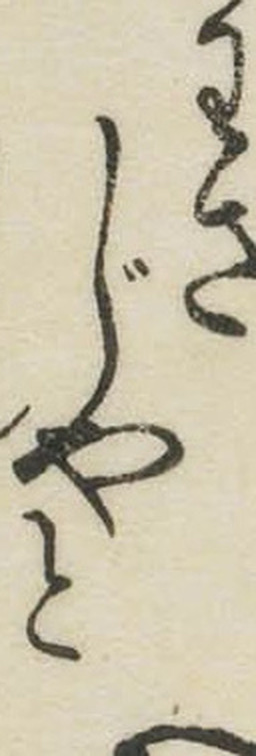じやと
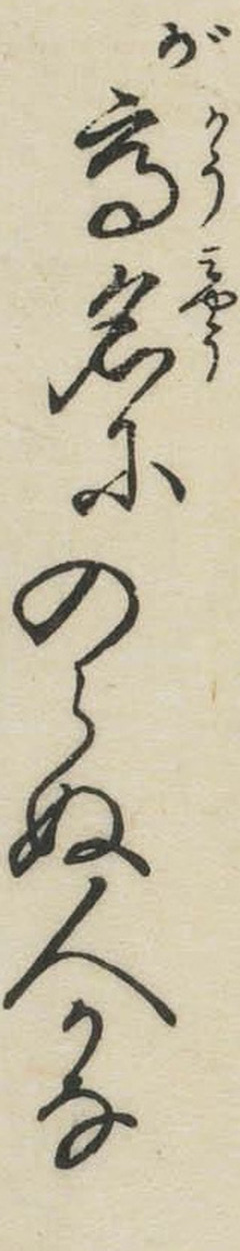我が高名にのらぬ人かな

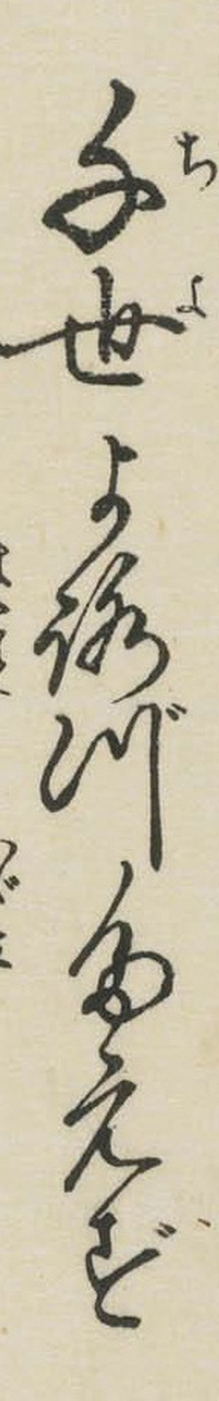千世よろづたえず
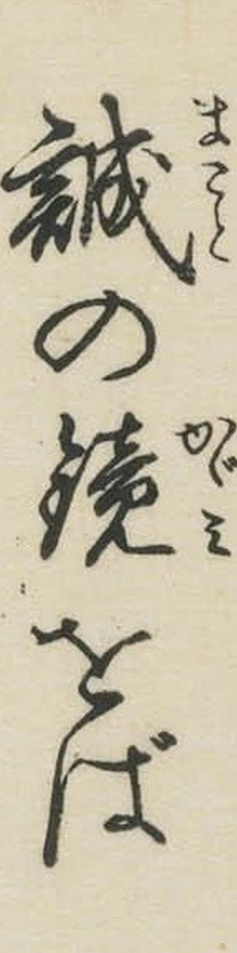誠の鏡をば
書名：福神おしへの小槌 2巻 上
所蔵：東京学芸大学教育コンテンツアーカイブ
